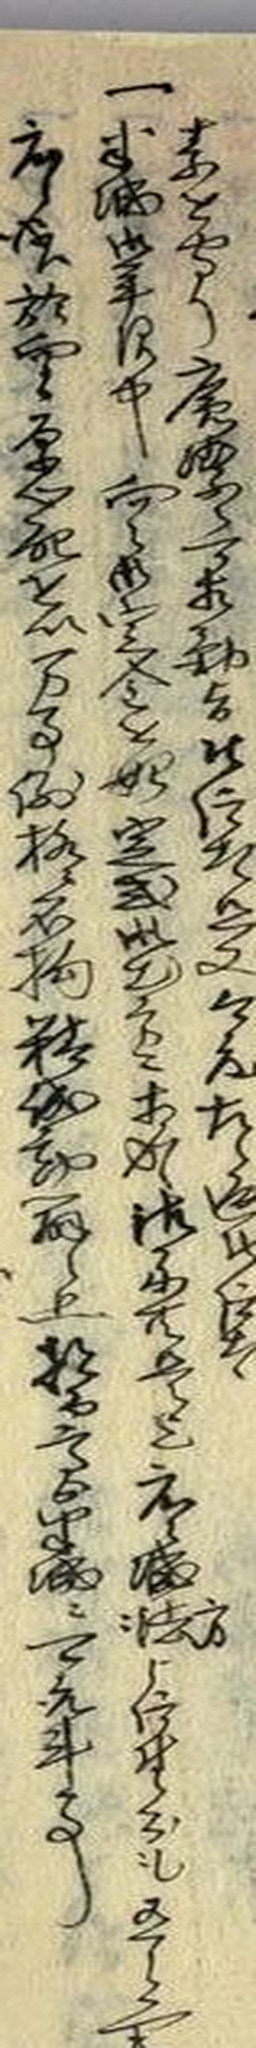度之儀ハ於向々厚心配を以万事例格ニ不拘精誠勘弁之上都而高ゟ半減ニ可取計事
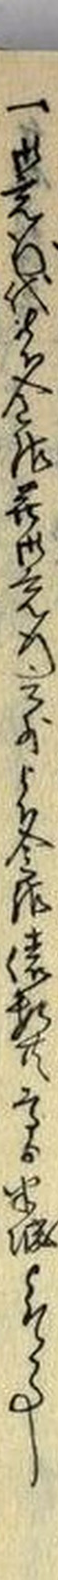一御充行代被下金銀幷御充行之外被下金銀俵数共高ゟ半減被下候事
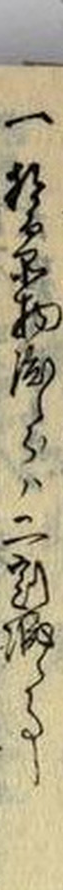一都而品物渡之分ハ二割減之事
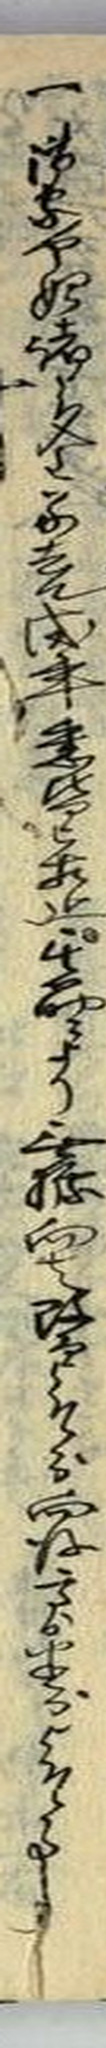一御家中始諸被下金米去ル戌年悉皆被相止其筋ニより無拠向者改而被下候分向後高ゟ半分被下候事
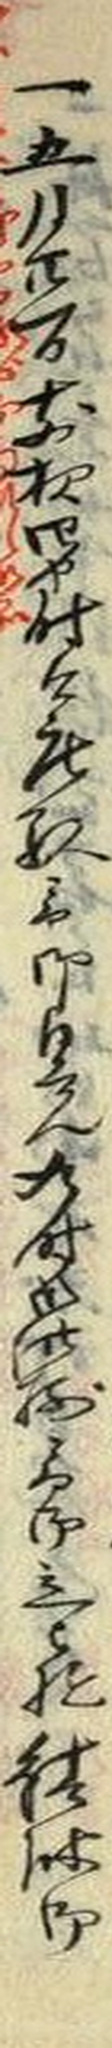一五月廿一日前夜四半時今庄駅ニ而御目覚九時御供揃ニ而御立被遊鯖波御
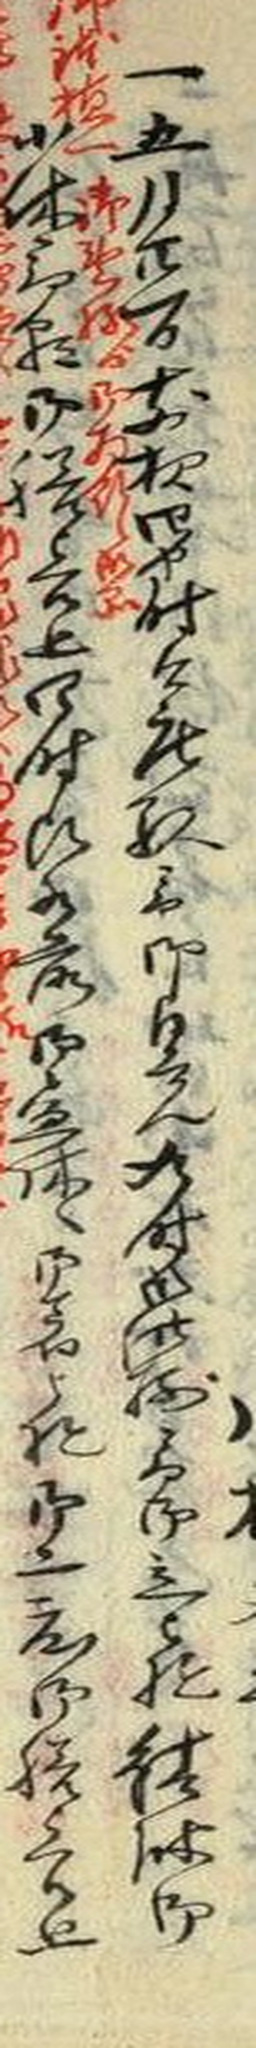小休ニ而朝御膳被召上四時頃水落御昼休へ御着被遊御二度御膳被召上
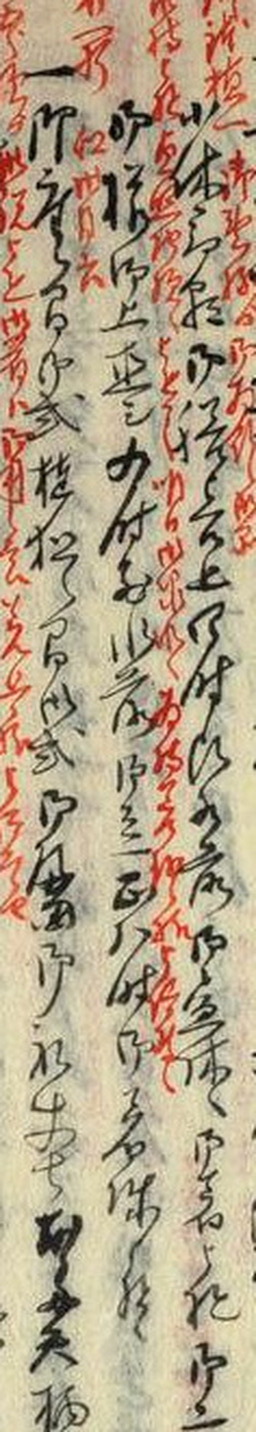御櫛御上直シ九時前水落御立正八時御着城被遊候
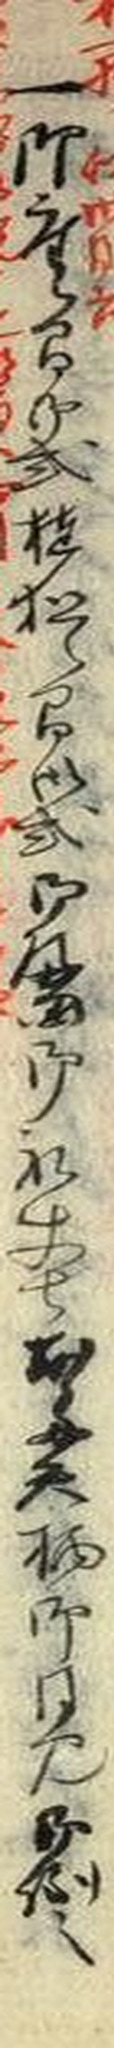一御座之間御式韃靼之間御式御帰国御礼使者本多矢柄御目見御例之
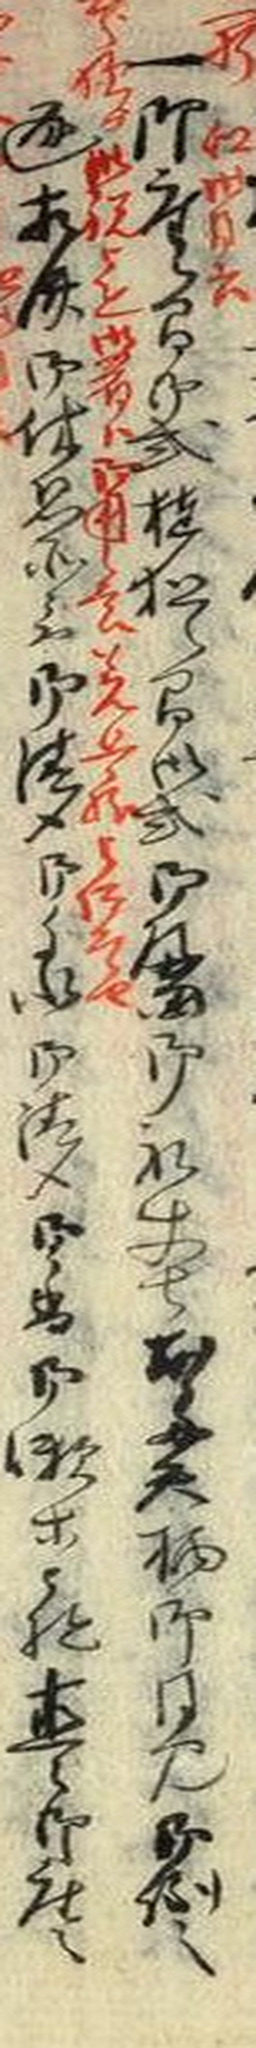通相済御休息所ニ而御清メ御手水御清メ御沓御嗽等被遊直ニ御座之
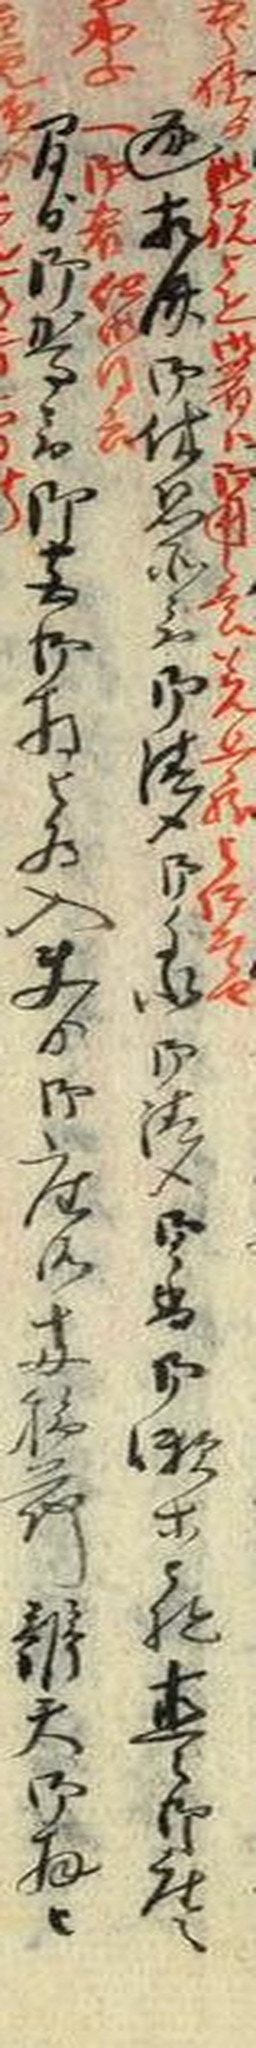間ゟ御駕ニ而御宮御拝被為入夫ゟ御座所両稲荷弁天御拝被
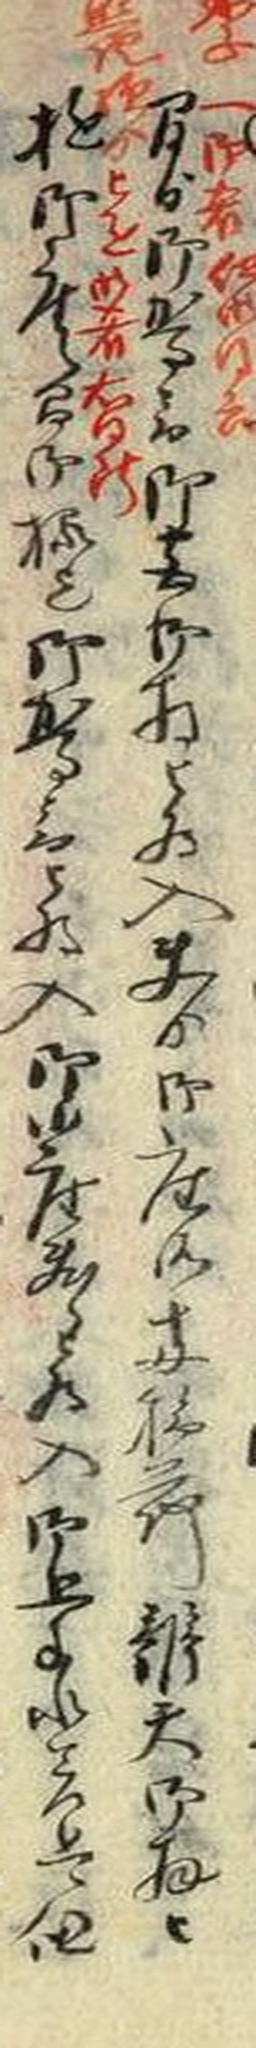遊御座之間御縁迄御駕ニ而被為入御小座敷へ被為入御上手水差上候但
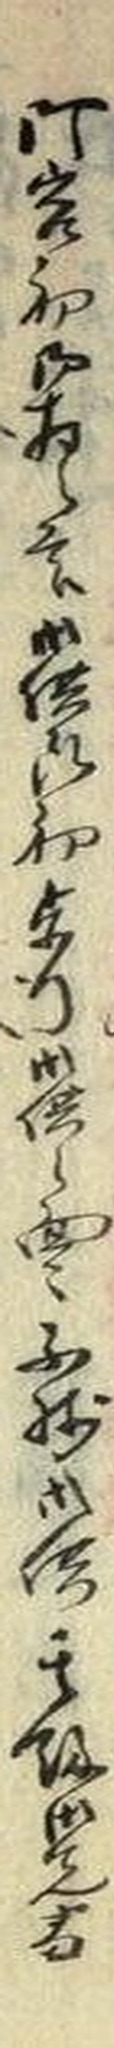御宮初御拝之節御供頭初歩行御供之面々不残御供其余御先番
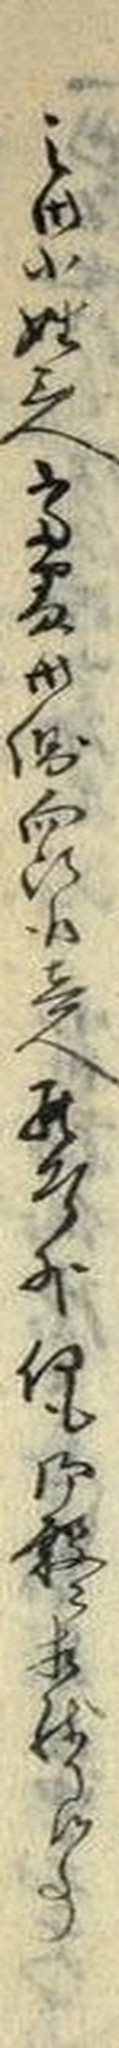之御小姓三人当番御側向頭取壱人罷出候外何も御殿ニ相残り候事
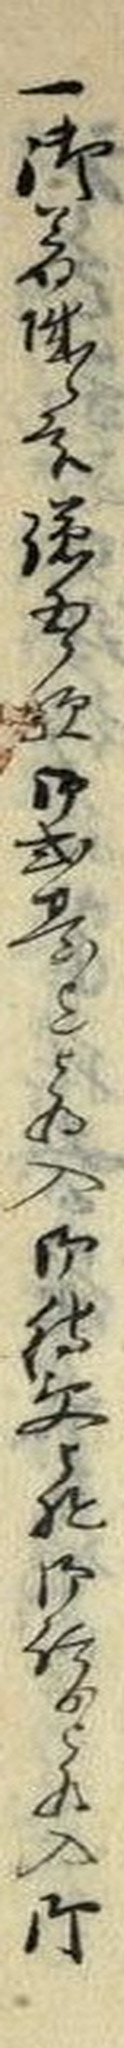一御着城之節謙五郎様御式台迄被為入御待受被遊御跡ゟ被為入御

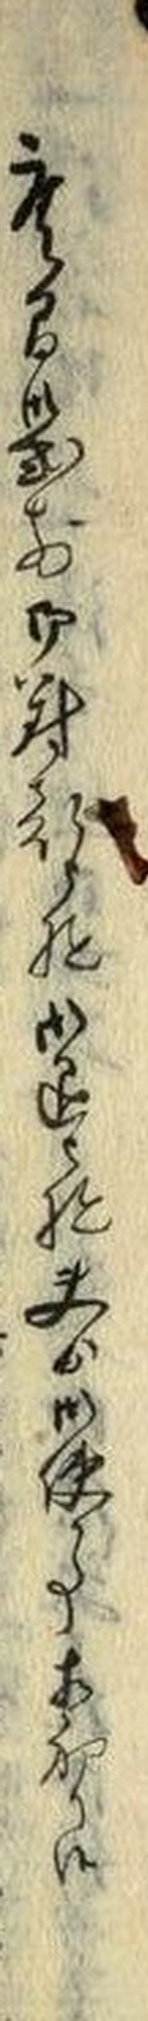座之間御式前御対顔被遊御退被遊夫ゟ御使事相初り候
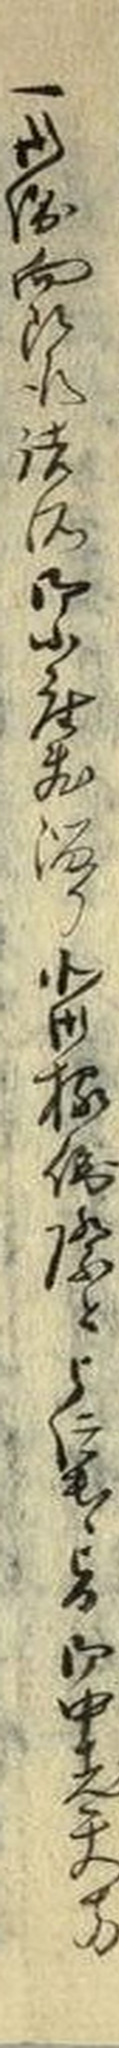一御側向頭取詰所御小座敷溜り北御縁側際と被仰出候旨御中老天方
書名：少傅日録抄（斉承付側向頭取日記、在国）
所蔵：福井県文書館 Fukui Prefectural Archives
